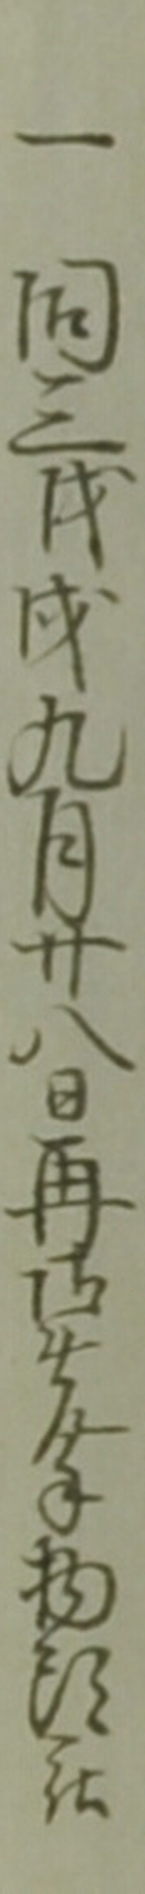一同三戊戌九月廿八日再御先手物頭被
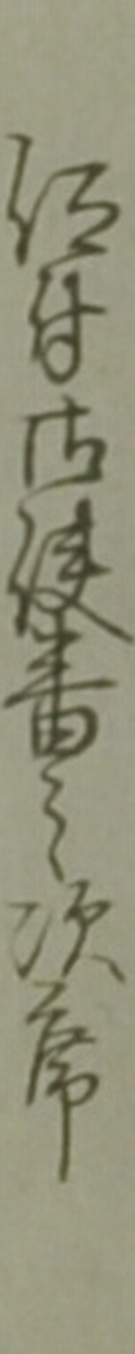仰付御使番之次席

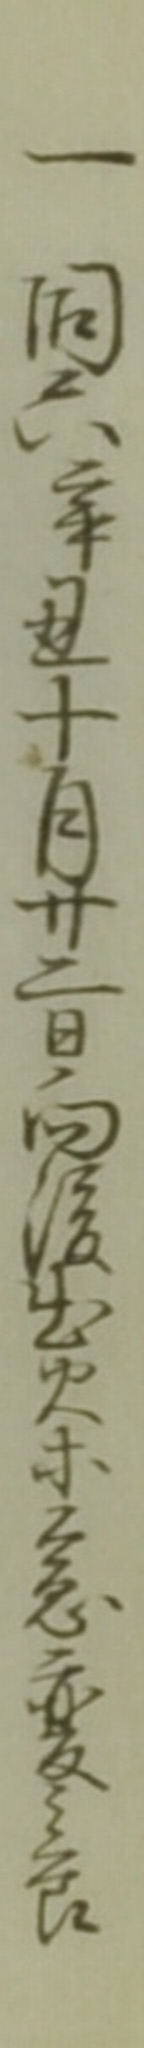一同六辛丑十月廿ニ日向後出火等急変之節
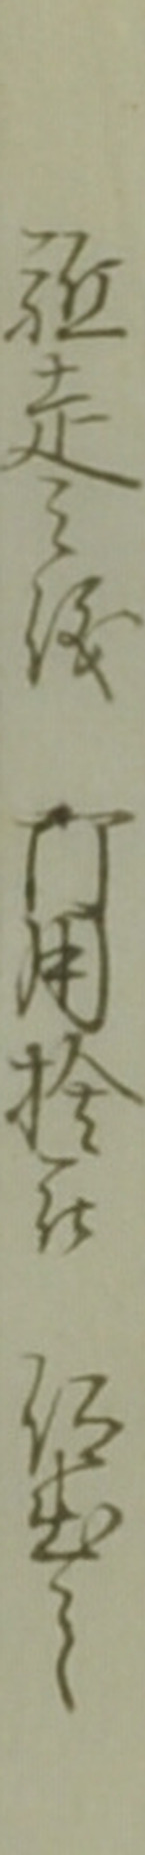駈走之儀御用捨被仰付之
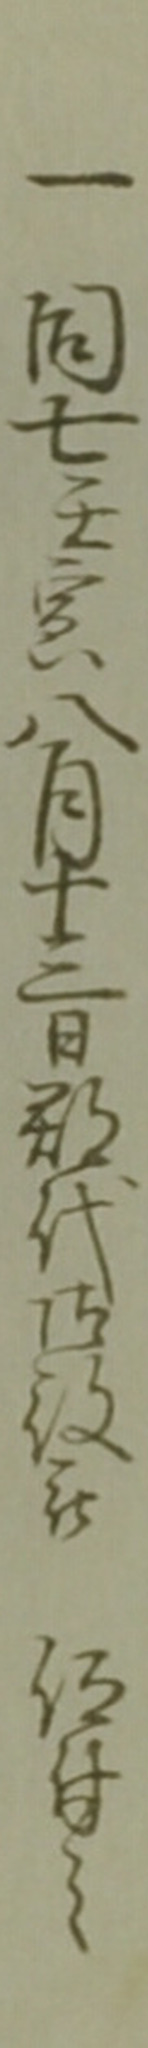一同七壬寅八月十三日郡代御役被仰付之
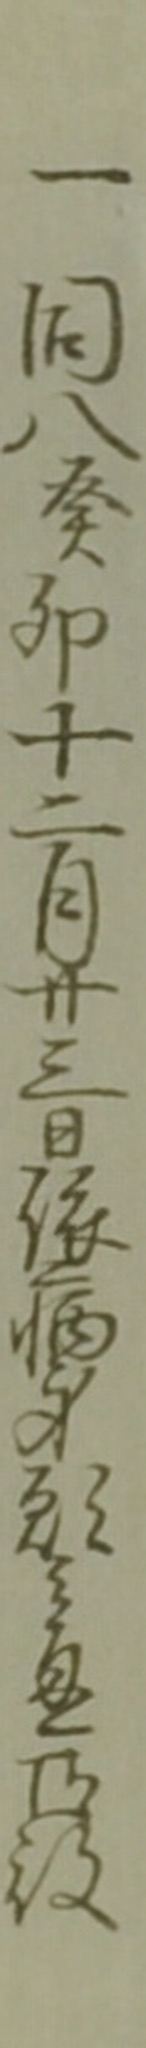一同八癸卯十二月廿三日依病身願之通御役
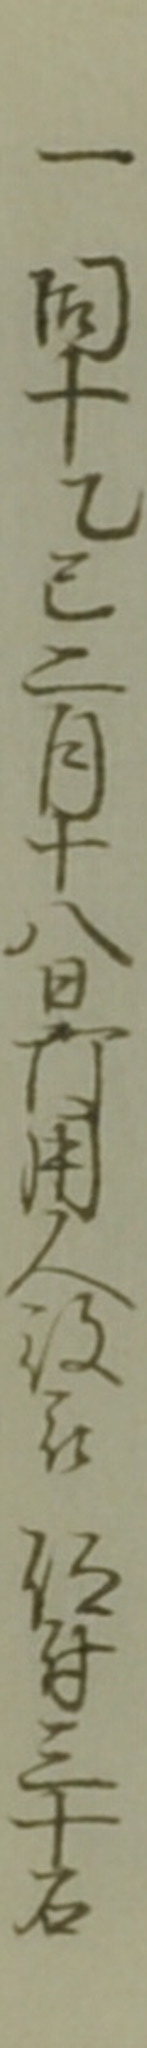一同十乙巳二月十八日御用人役被仰付三十石
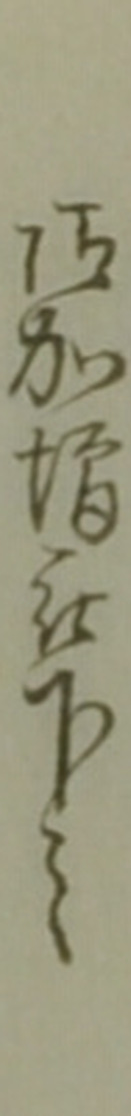御加増被下之
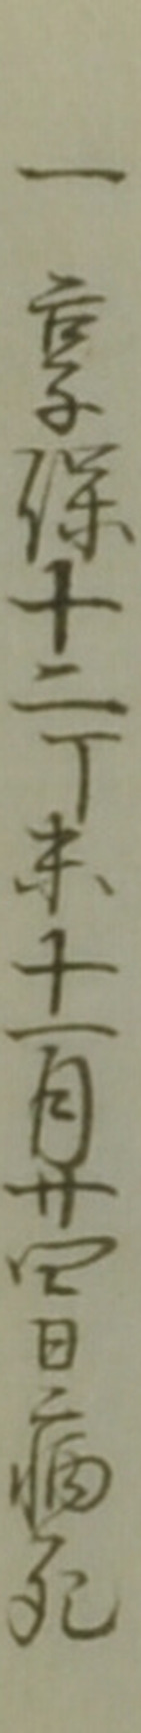一享保十二丁未十一月廿四日病死
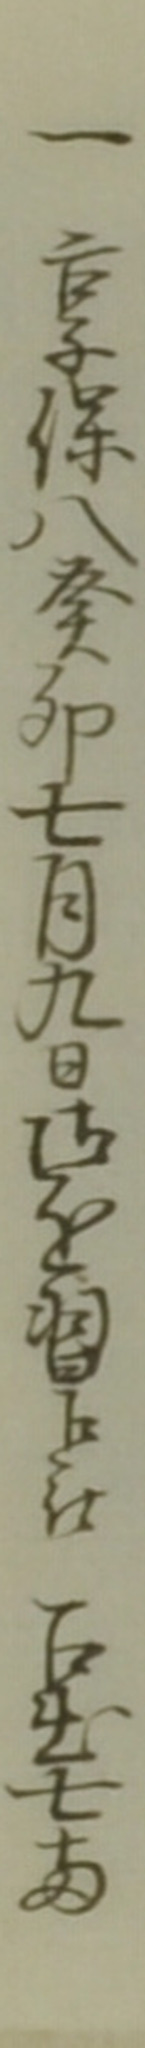一享保八癸卯七月九日御近習え被召出七両
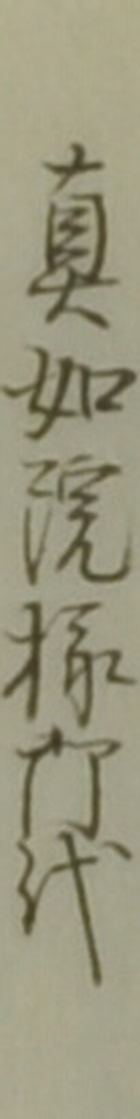真如院様御代
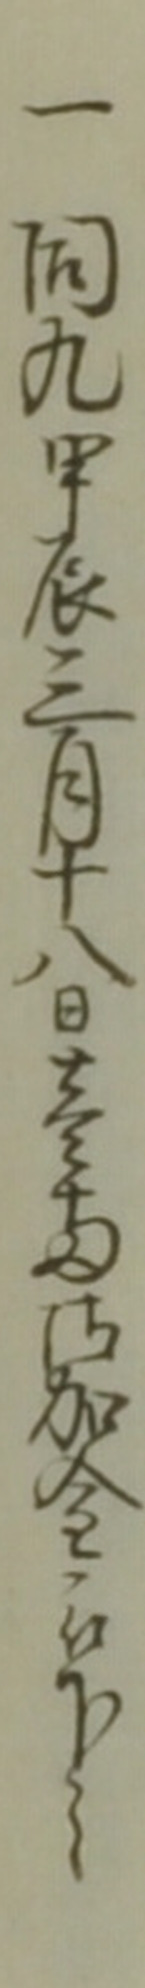一同九甲辰三月十八日壱両御加金被下之
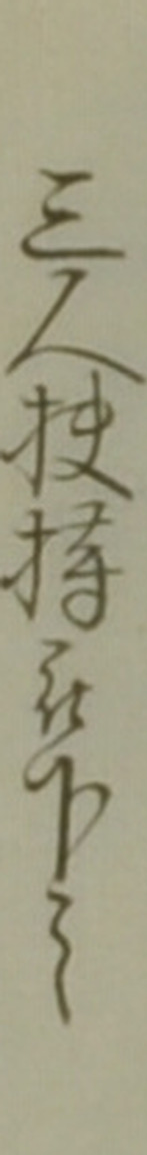三人扶持被下之
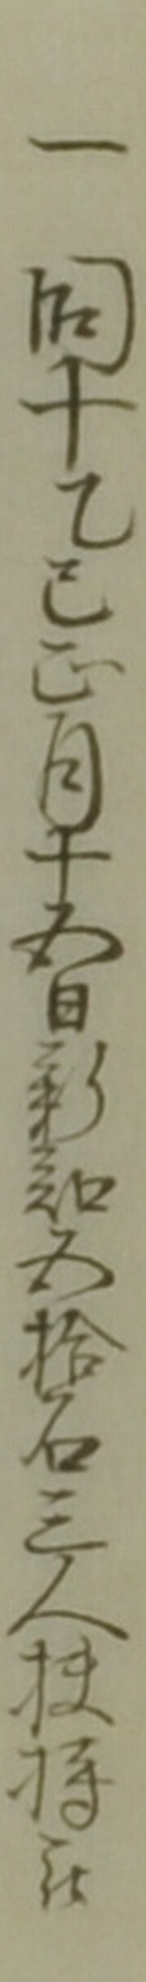一同十乙巳正月十五日新知五拾石三人扶持被
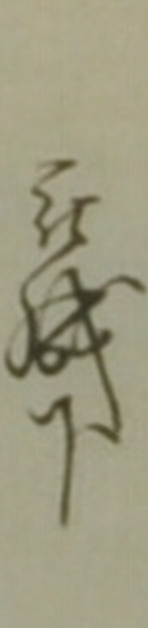被成下
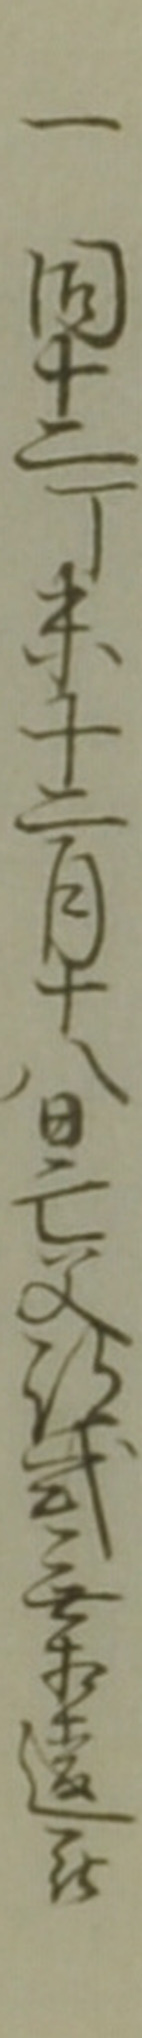一同十二丁未十二月十八日亡父跡式無相違被
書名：給人諸士勤仕録（三）
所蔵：伊那市立高遠町図書館・合同会社AMANE
